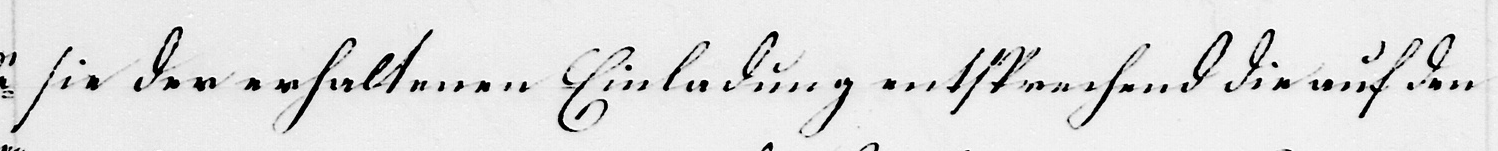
sie der erhaltenen Einladung entsprechend die auf den
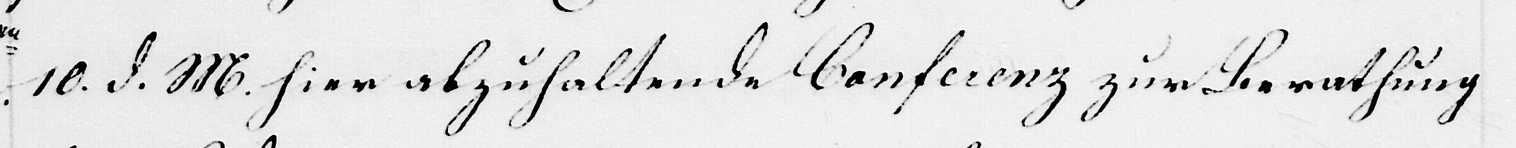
10. d. M. hier abzuhaltende Conferenz zur Berathung
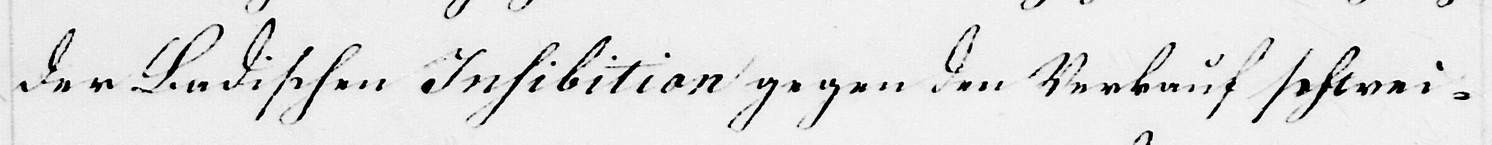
der Badischen Inhibition gegen den Verkauf schwei¬
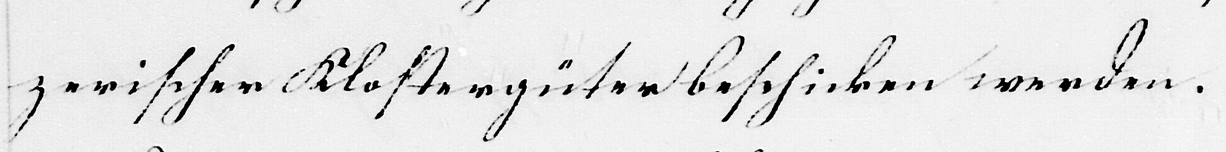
zerischer Klostergüter beschicken werden.
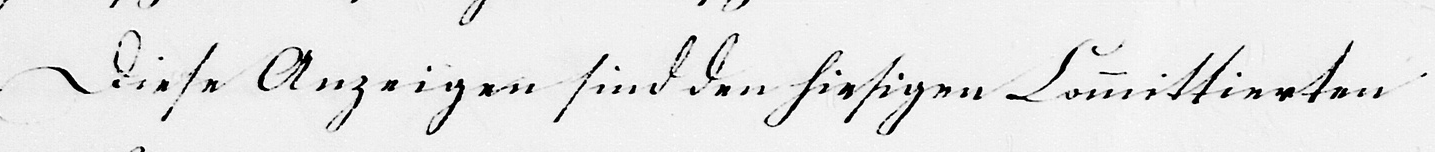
Diese Anzeigen sind den hiesigen Committierten
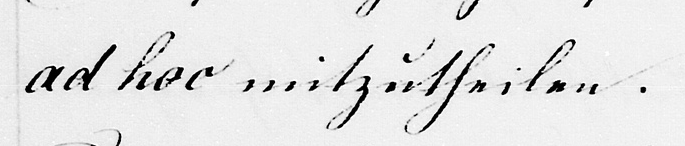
ad hoc mitzutheilen.
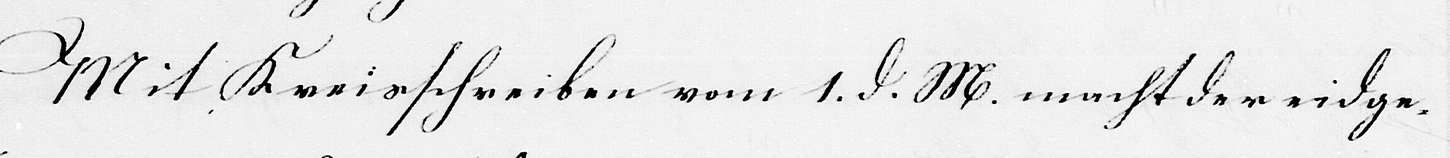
Mit Kreisschreiben vom 1. d. M. macht der eidge¬
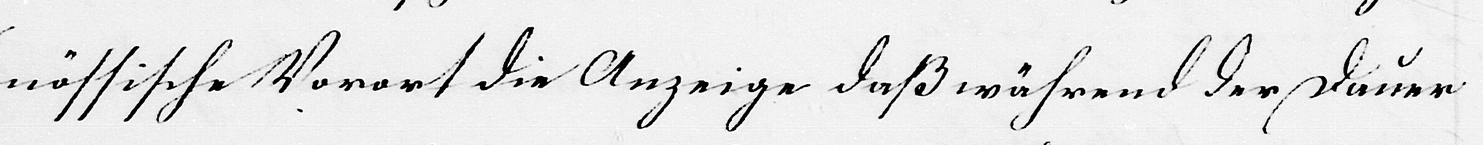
nössische Vorort die Anzeige daß während der Dauer
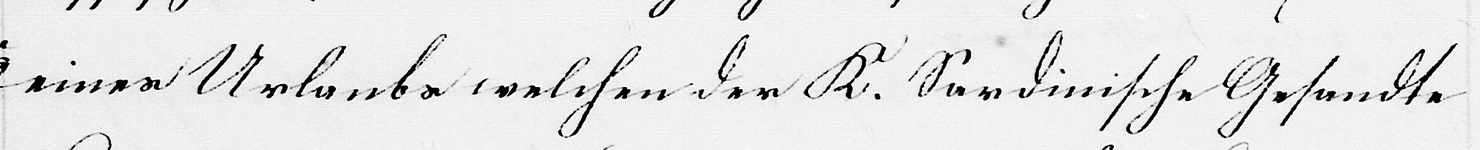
eines Urlaubs welchen der K. Sardinische Gesandte
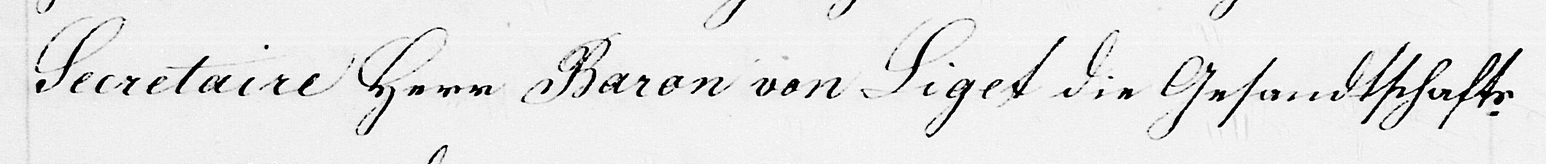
ecretaire Herr Baron von Liget die Gesandtschafts¬
